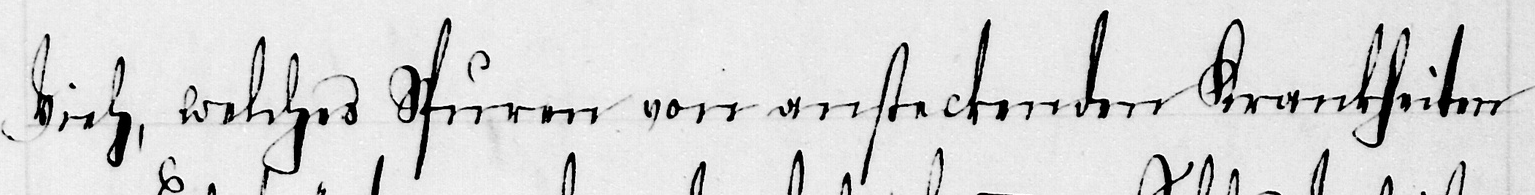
Vieh, welches Spuren von ansteckenden Krankheiten
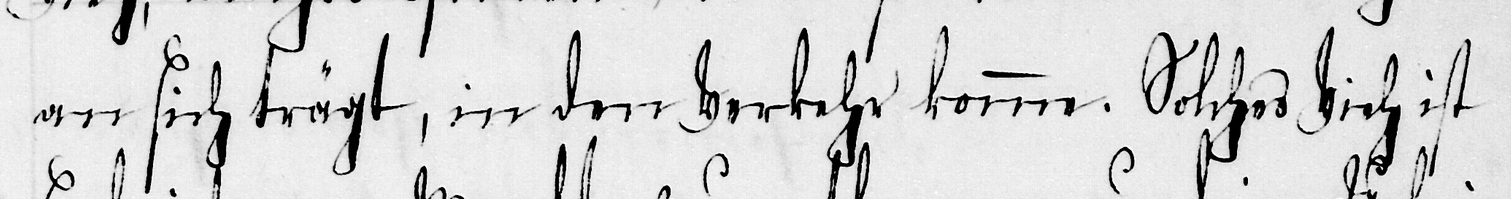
an sich trägt, in den Verkehr komme. Solches Vieh ist
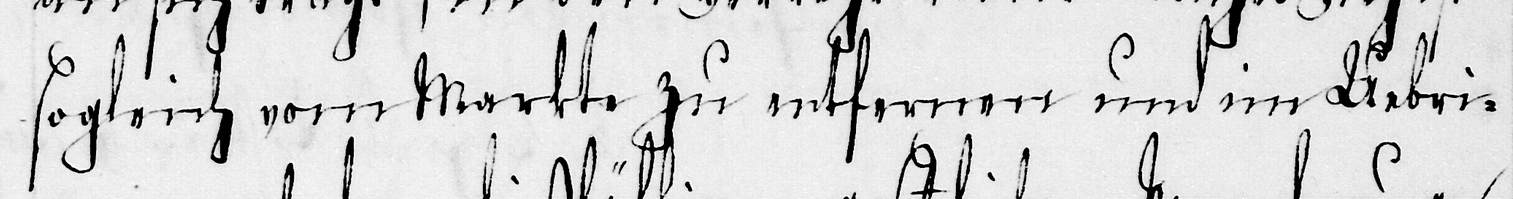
sogleich vom Markte zu entfernen und im Uebri¬
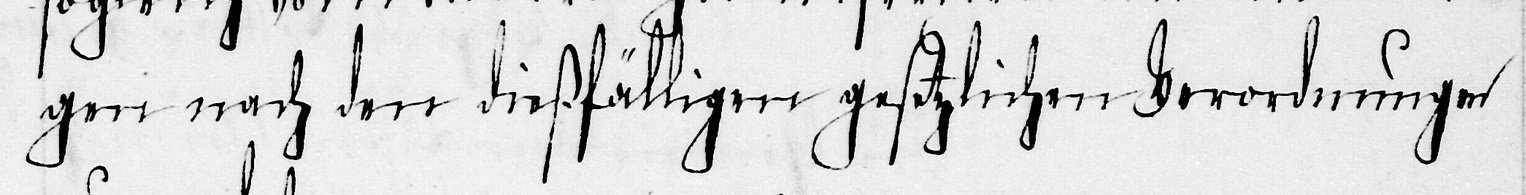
gen nach den dießfälligen gesetzlichen Verordnungen
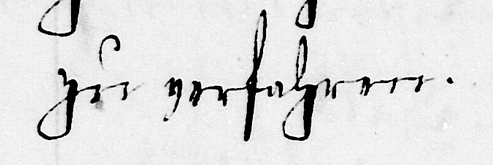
zu verfahren.
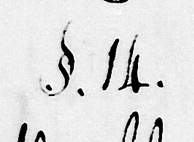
§. 14.
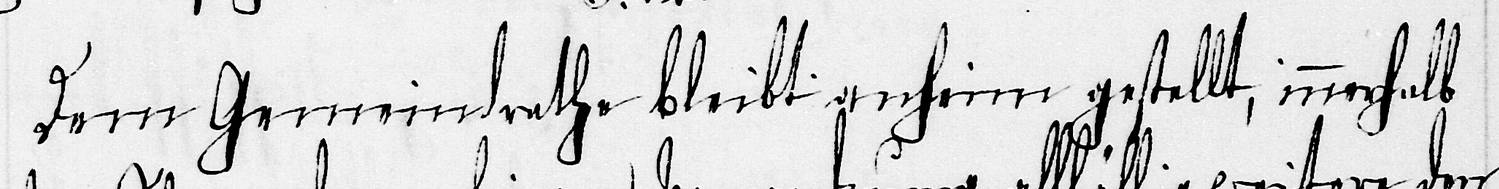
Dem Gemeindrathe bleibt anheim gestellt, innerha¬
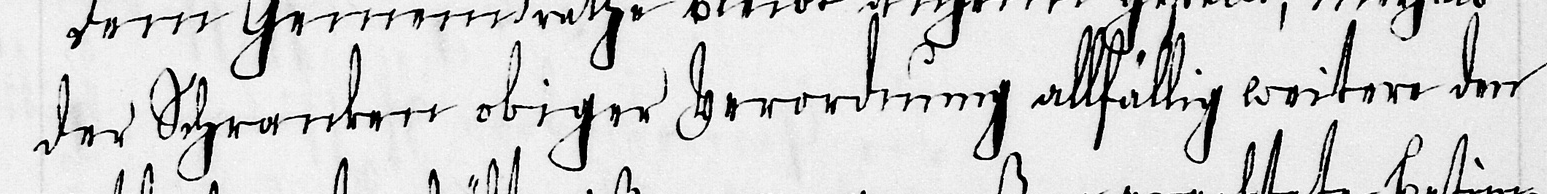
der Schranken obiger Verordnung allfällig weitere den
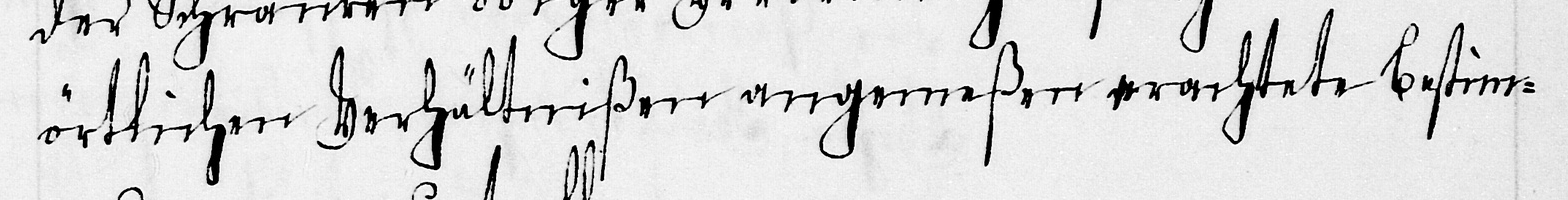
örtlichen Verhältnißen angemeßen erachtete Bestim¬
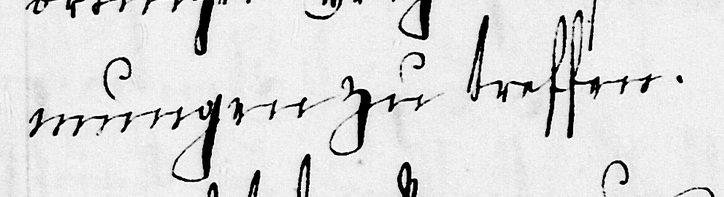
mungen zu treffen.
